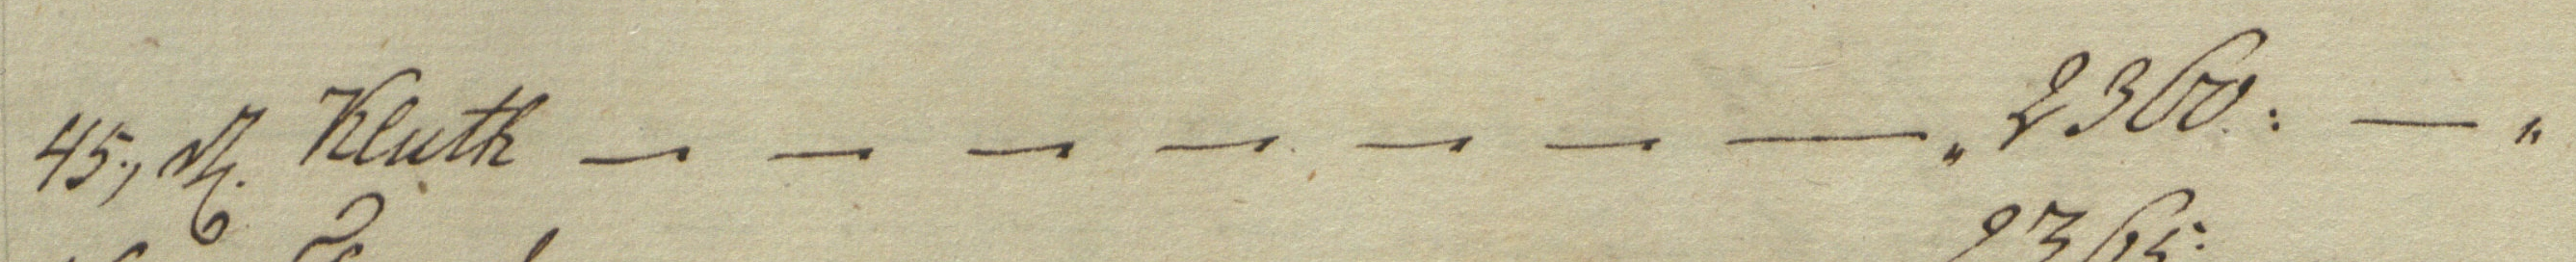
45, dh. Kluth 2360:
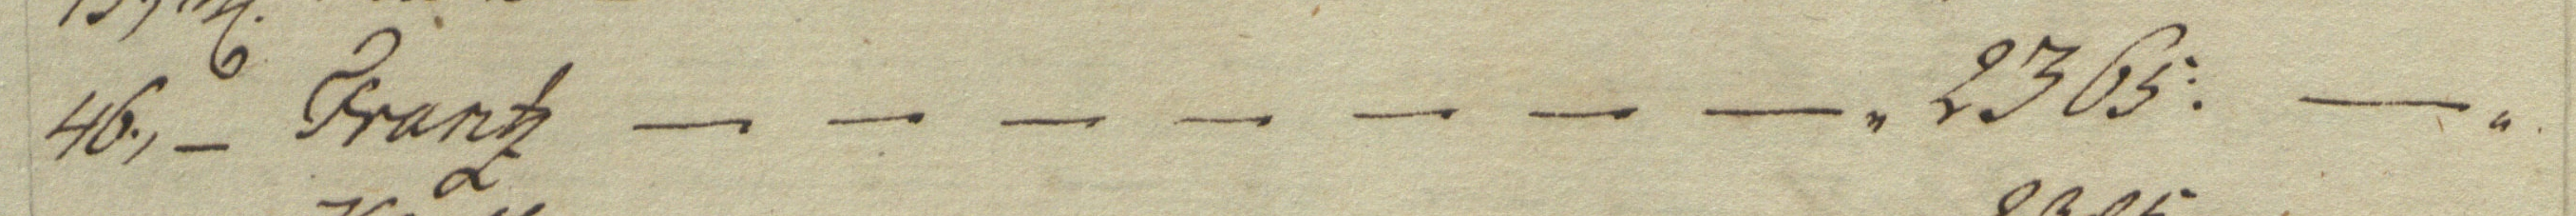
46., Frantz 2365:
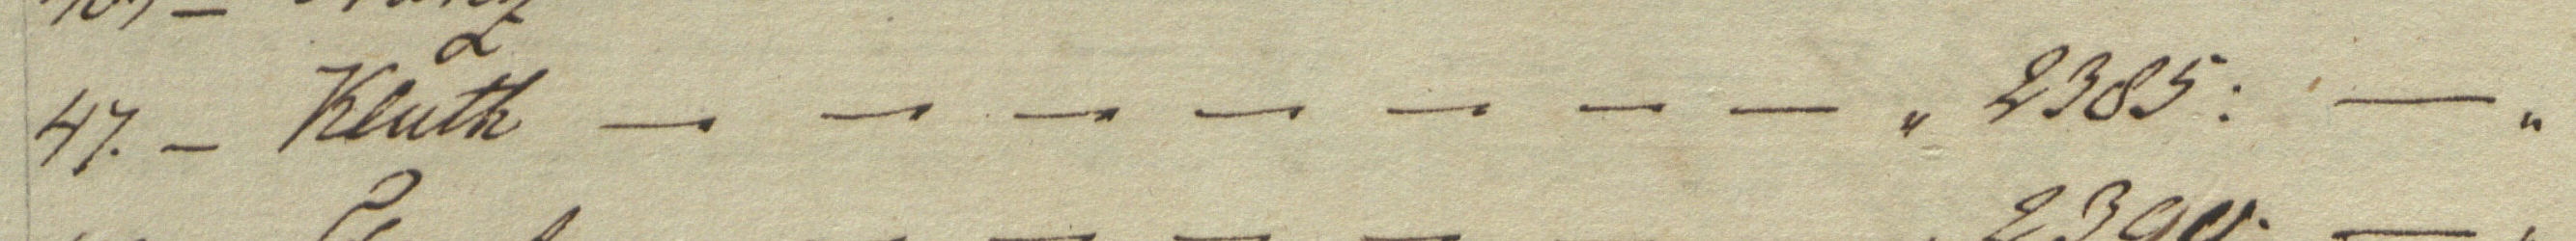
47. Kluth 2380:
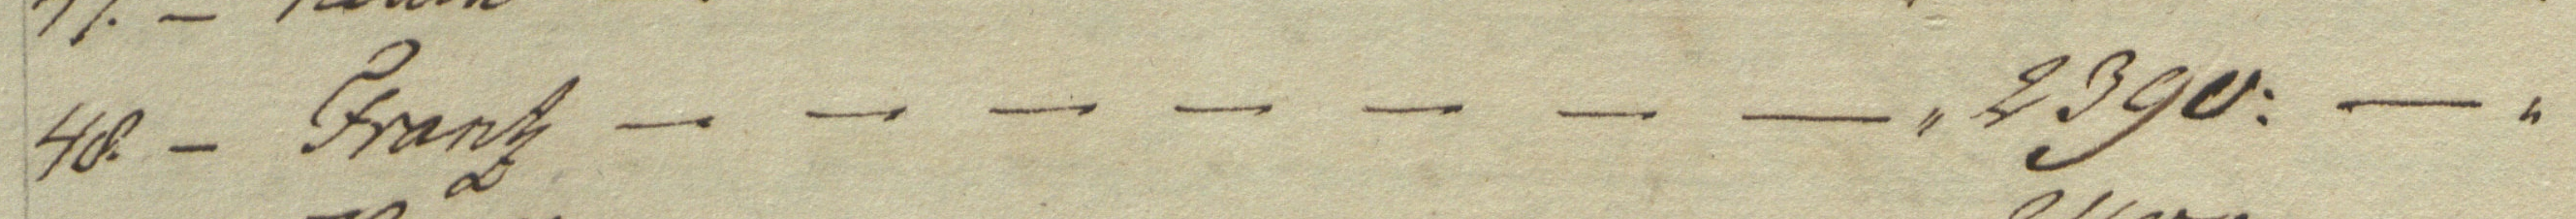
48. Frantz 2390:
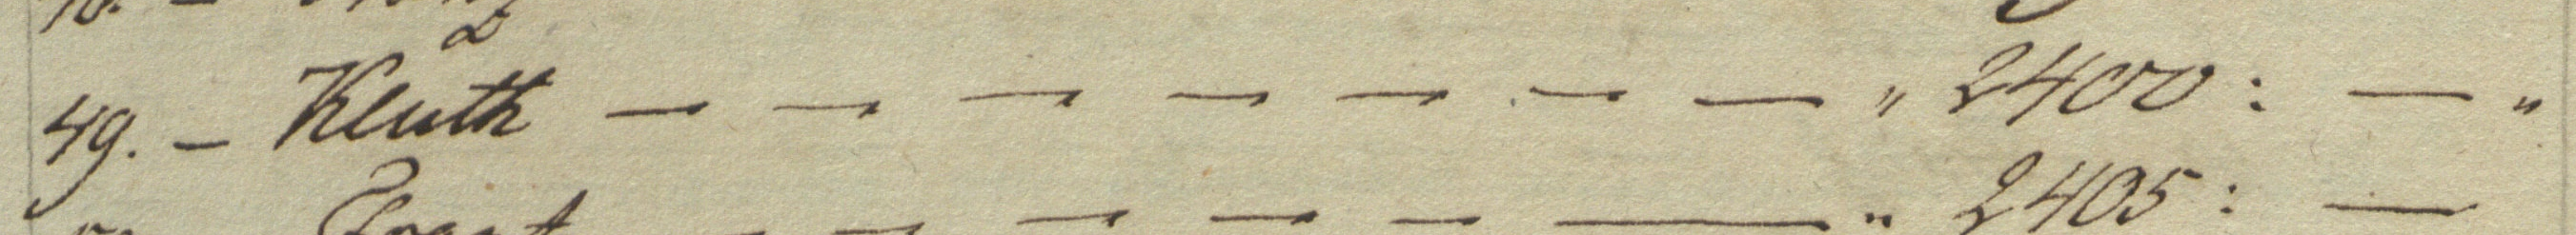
49. Kluth 2400:
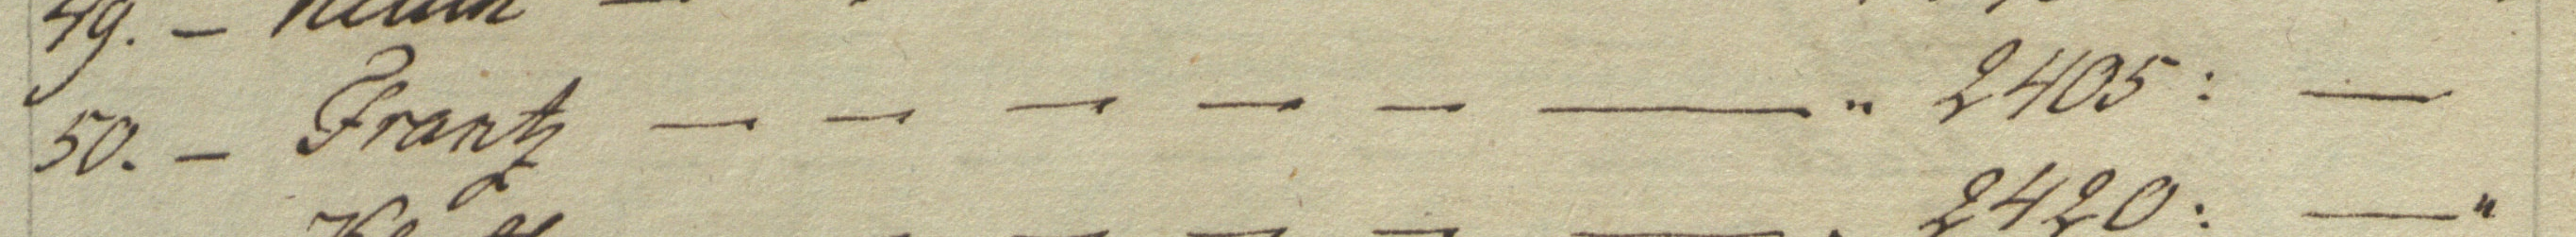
50. Frantz 2405:
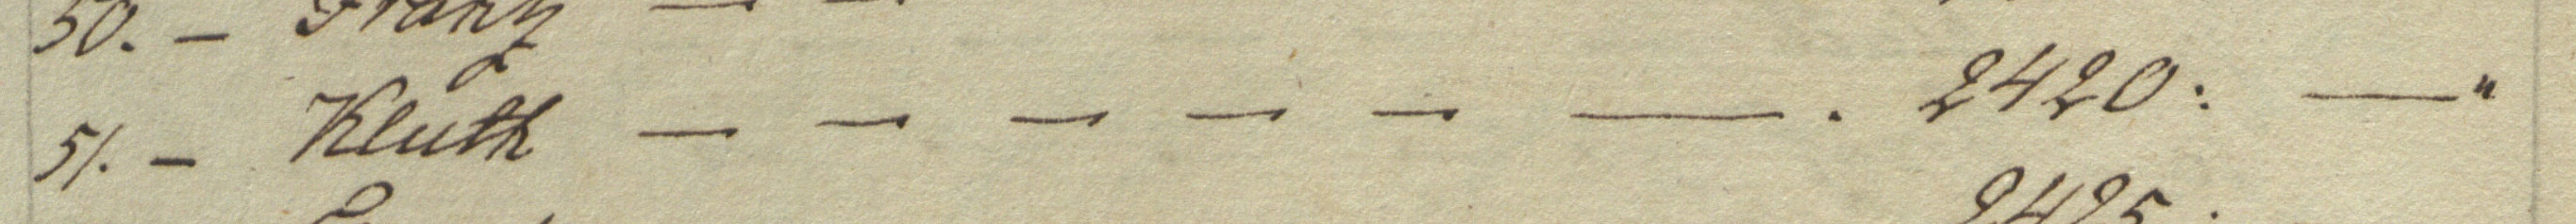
51. Kluth 2420:
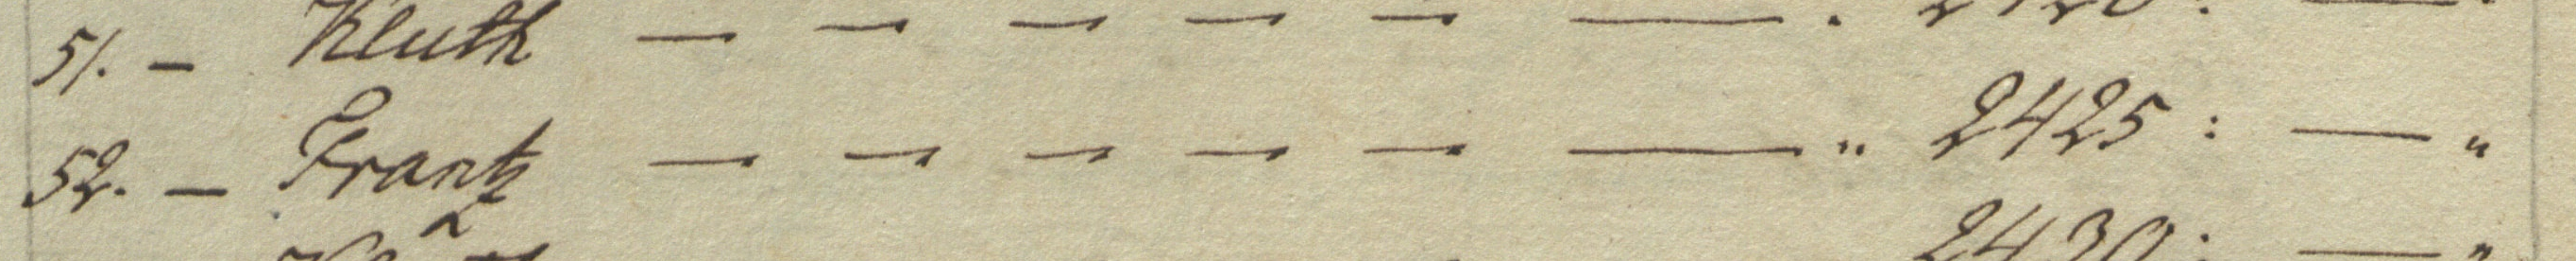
52. Frantz 2425:
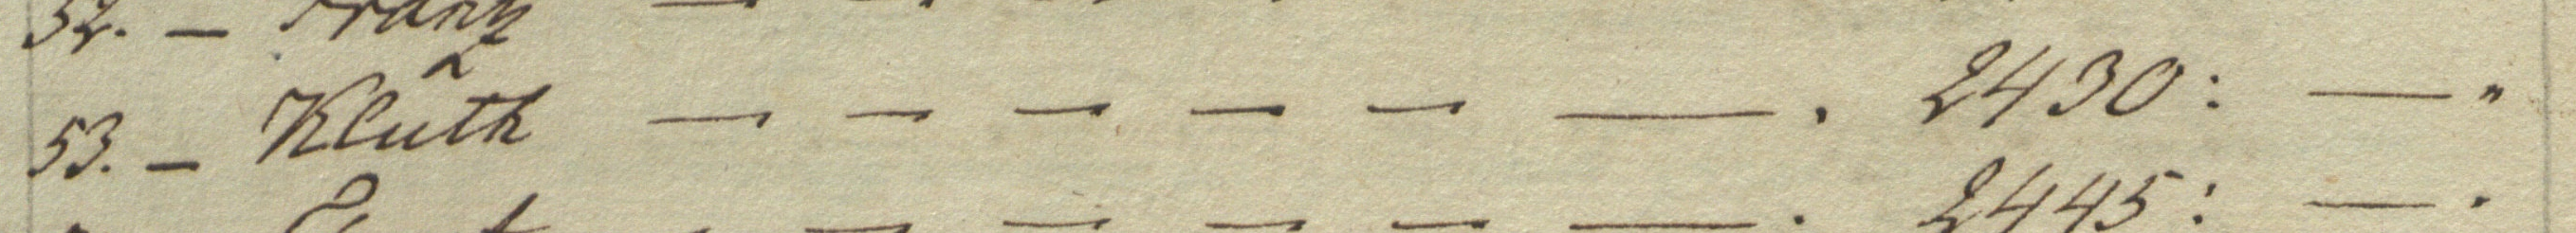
53. Kluth 2430:
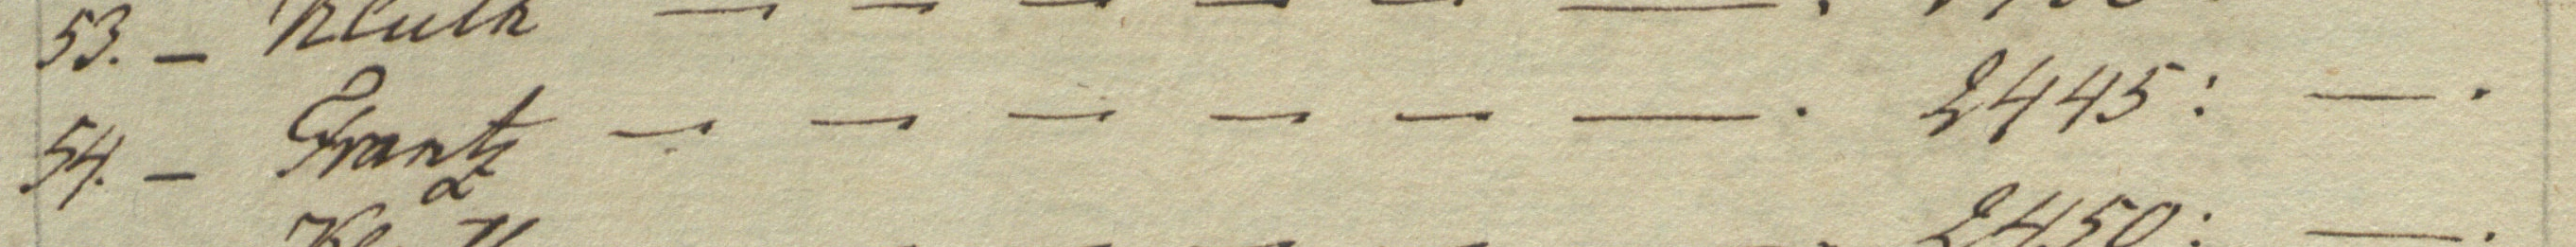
54. Frantz 2445:
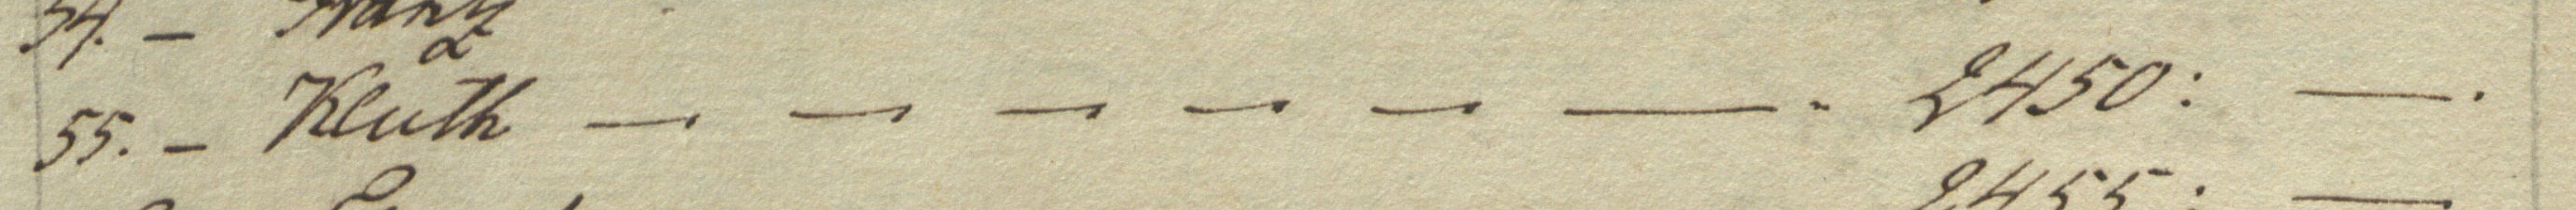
55. Kluth 2450:
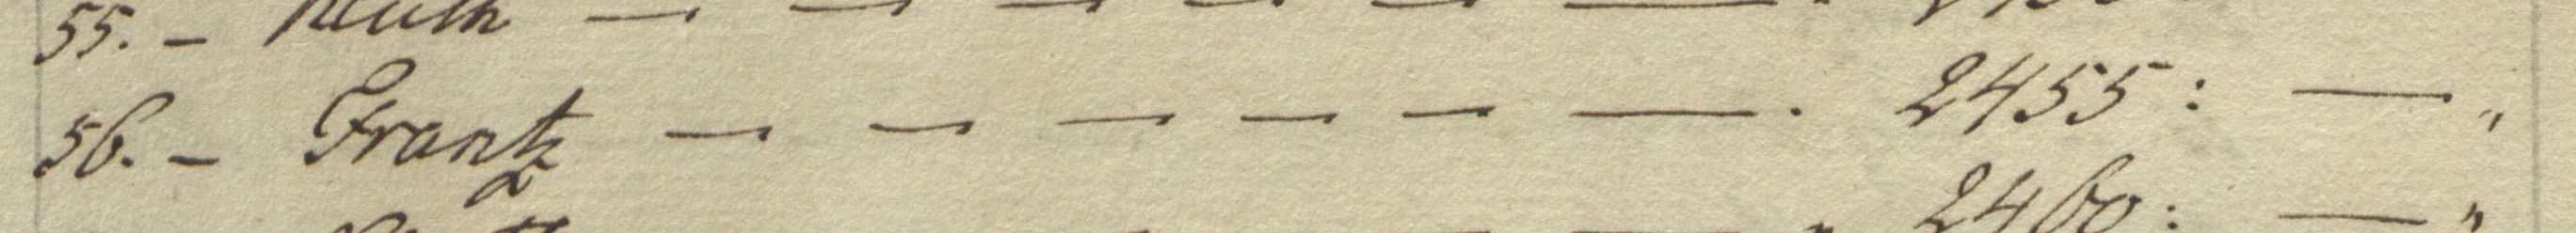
56. Frantz 2455:
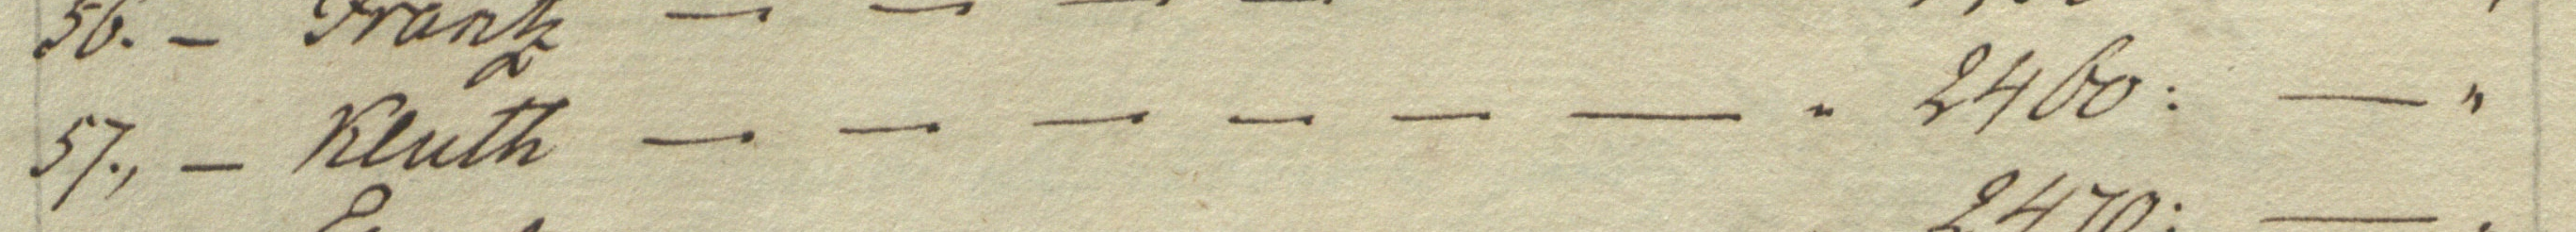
57., Kluth 2460:
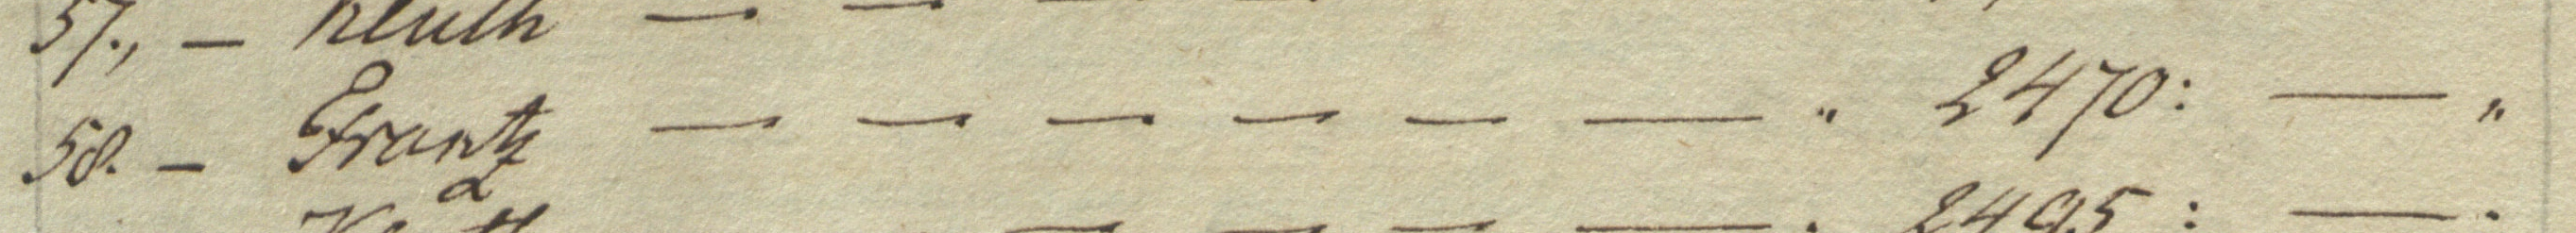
58. Frantz 2470:
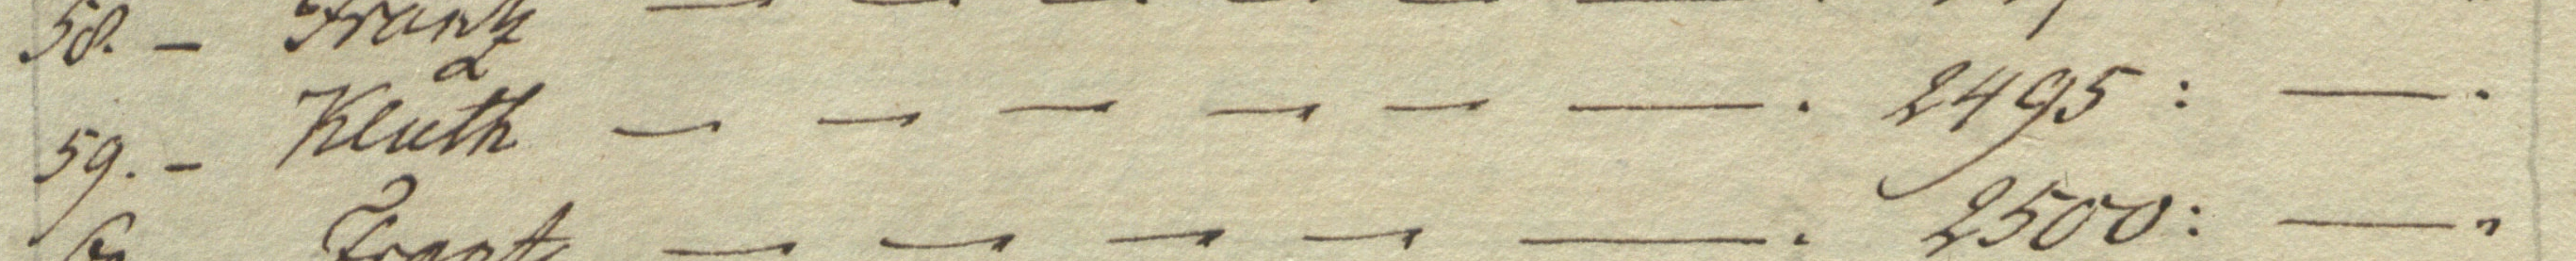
59. Kluth 2495:
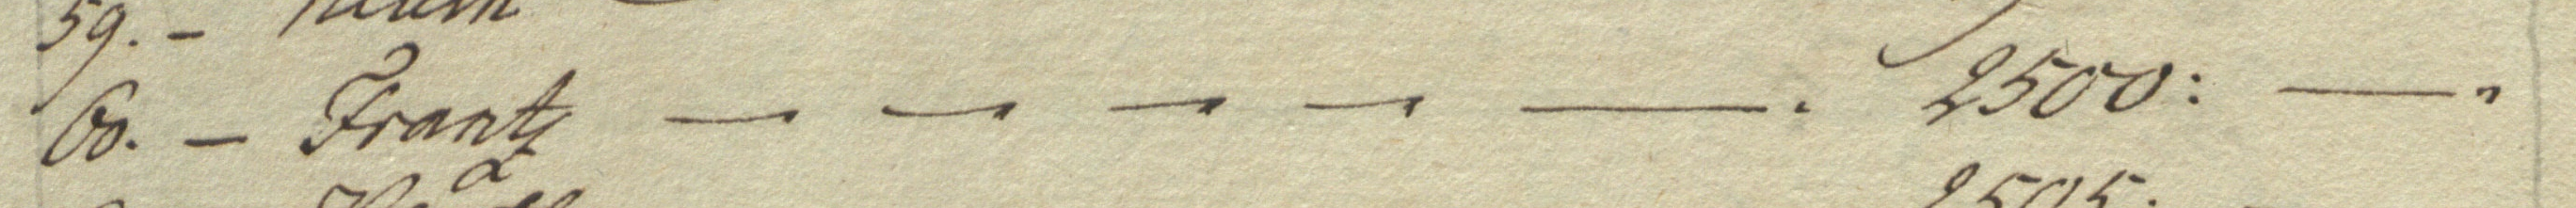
60. Frantz 2500:
